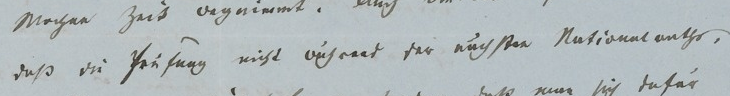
daß die Prüfung nicht während der nächsten Nationalraths-
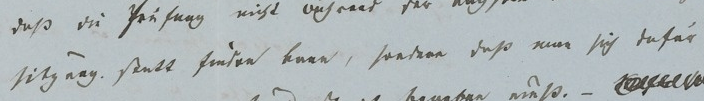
sitzung statt finden kann, sondern daß man sich dafür
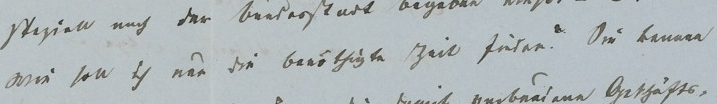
Wie soll ich nur die benöthigte Zeit finden? Sie kennen
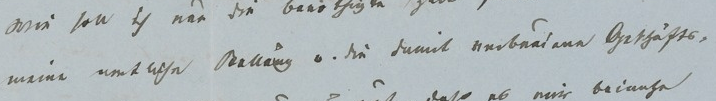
meine amtliche Stellung &. die damit verbundene Geschäfts-
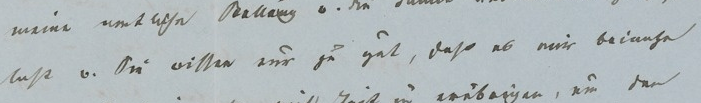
last &. Sie wissen nur zu gut, daß es mir beinahe
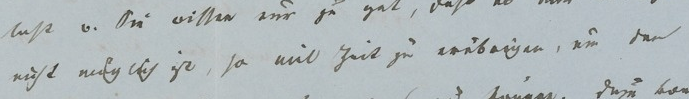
nicht möglich ist, so viel Zeit zu erübrigen, um den
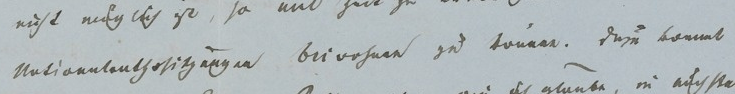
Nationalrathssitzungen beiwohnen zu können. Dazu kommt
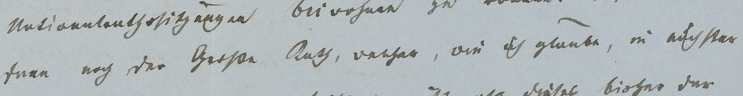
dann noch der Große Rath, welcher, wie ich glaube, in nächster
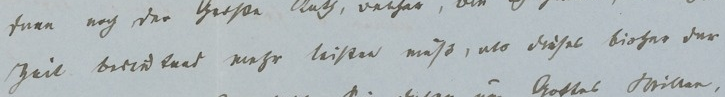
Zeit bedeutend mehr leisten muß, als dieses bisher der
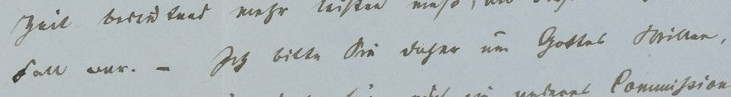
Fall war. – Ich bitte Sie daher um Gottes Willen,
